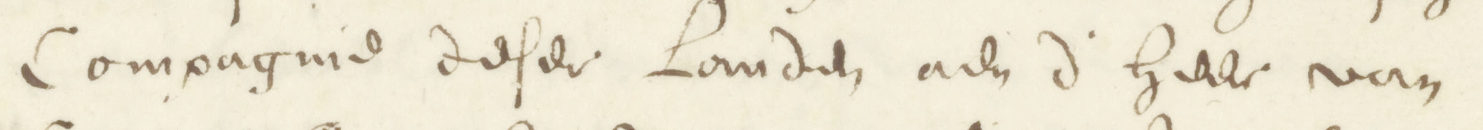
Compagnie deser Landen aen d'heer van
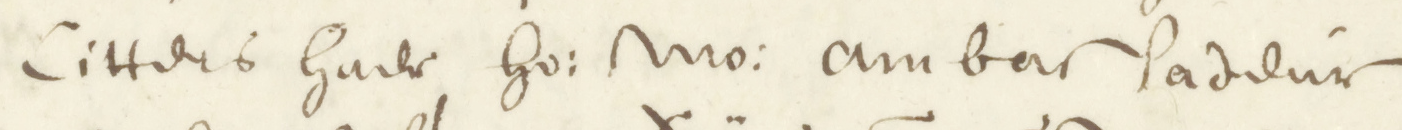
Citters haer ho:mo: ambassadeur
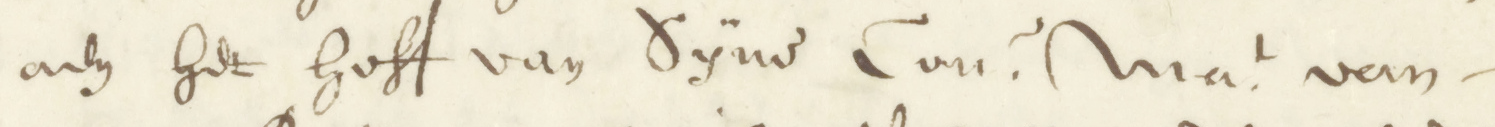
aen het hoff van Sijne Cone. Mat. van
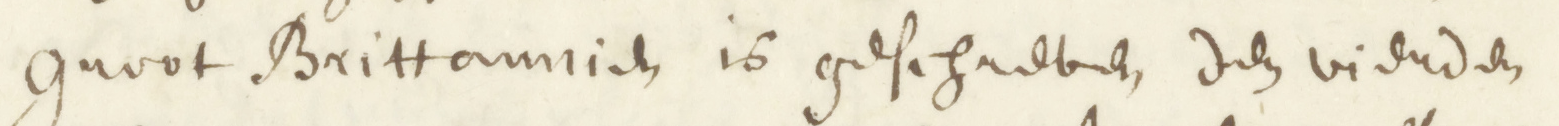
Groot Brittannien is geschreven den vierden
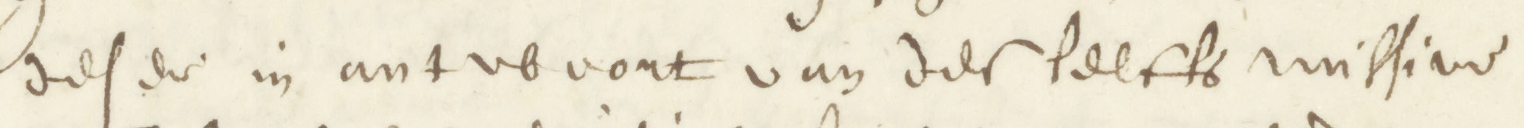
deser in antwoort van desselffs missive
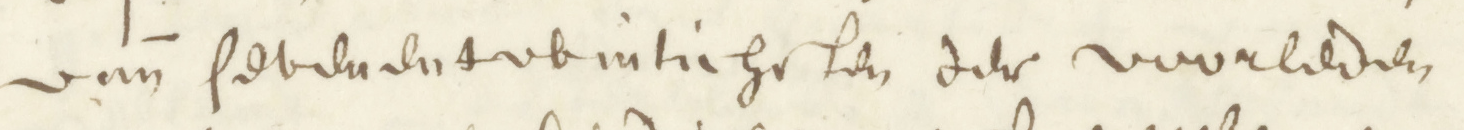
van sevenentwintichsten der voorleden
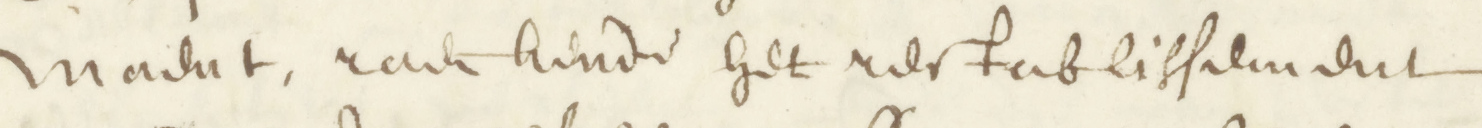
maent, raeckende het restablissement
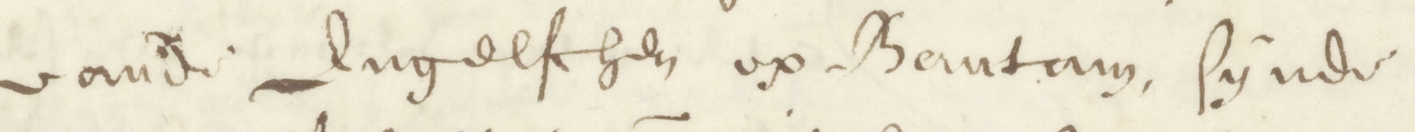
vande Engelschen op Bantam, sijnde
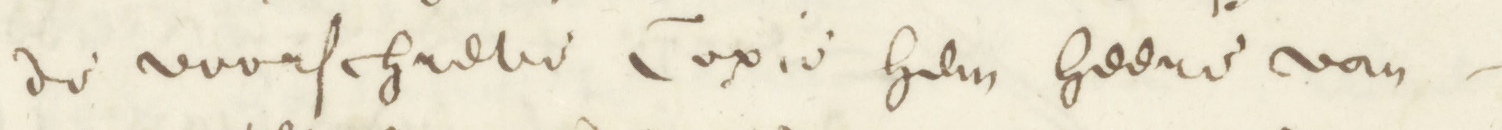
de voorschreve Copie hem heere van
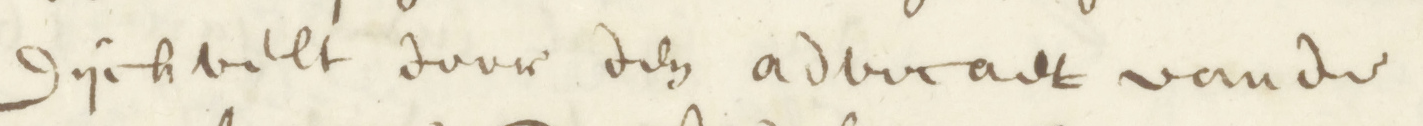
Dijckvelt door den advocaet van de
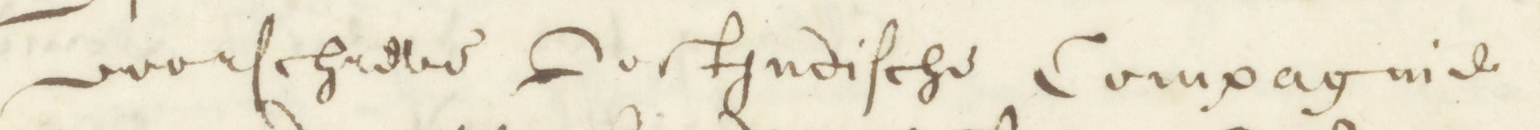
voorschreve Oostindische Compagnie
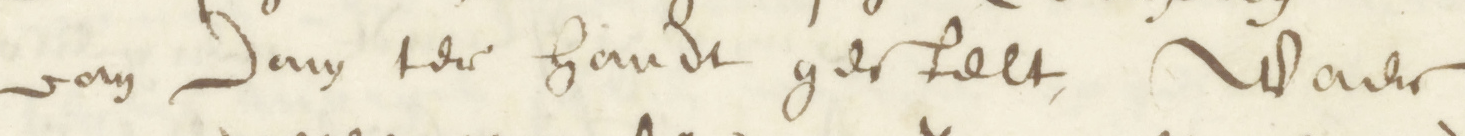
van Dam ter handt gestelt. Waer
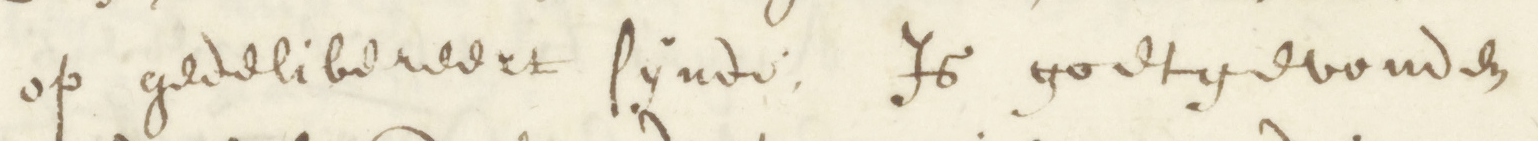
op gedelibereert sijnde; Is goetgevonden
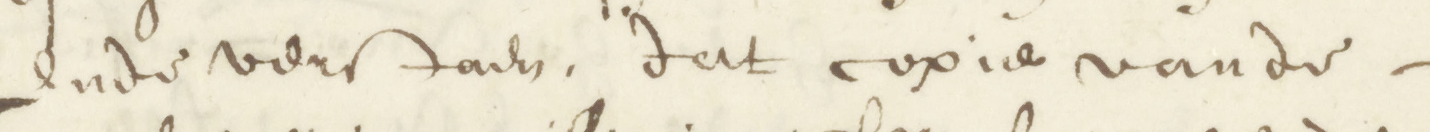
ende verstaen, dat copie vande
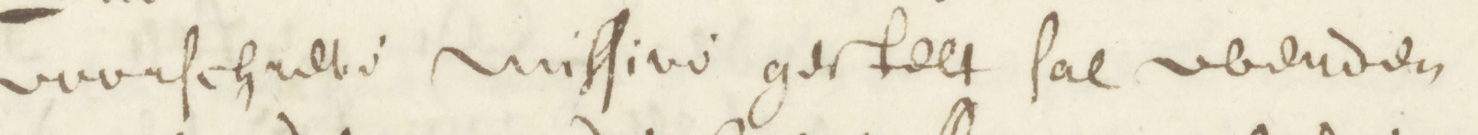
voorschreve missive gestelt sal werden
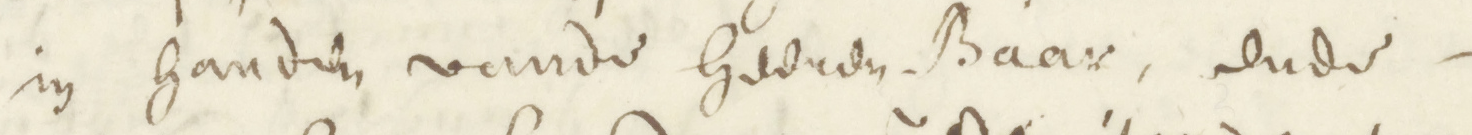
in handen vande heeren Baar, ende
